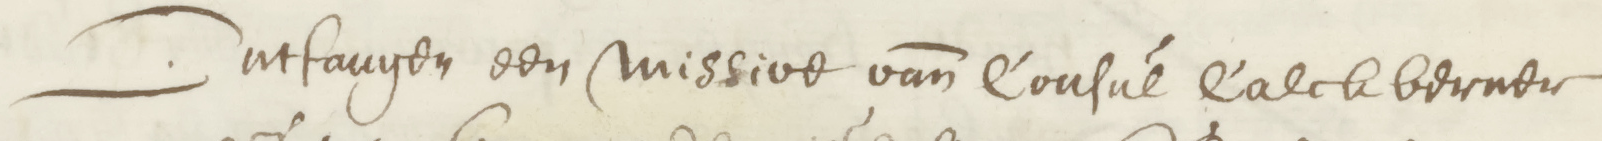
Ontfangen een missive van Consul Calckberner
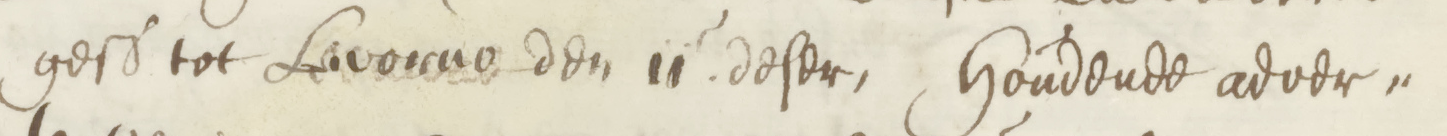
gess tot Livorno den 11e. deser, houdende adver„
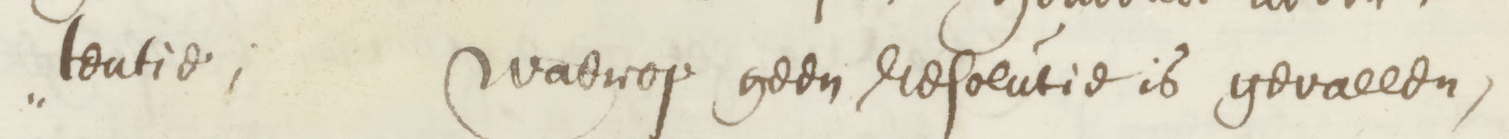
tentie: Waerop geen resolutie is gevallen.
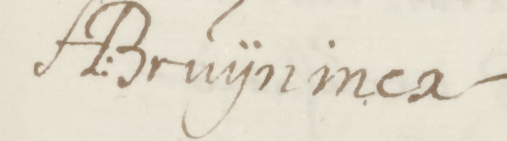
F: Bruijnincx
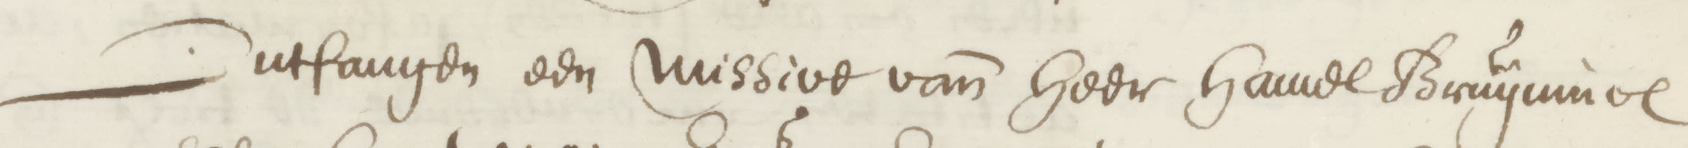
Ontfangen een missive van heer hamel Bruijnincx
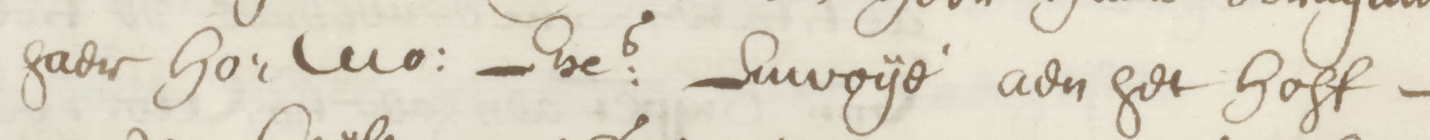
haer Ho:Mo: Exs: Envoijé aen het hoff
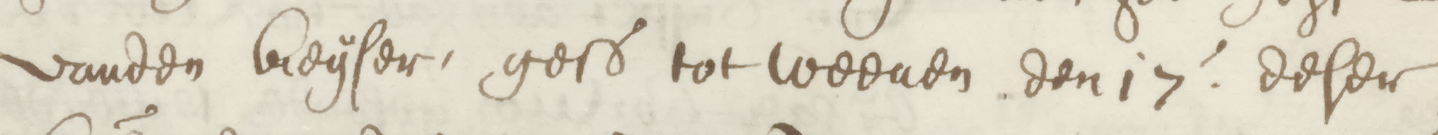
vanden keijser, gess tot weenen den 17e deser
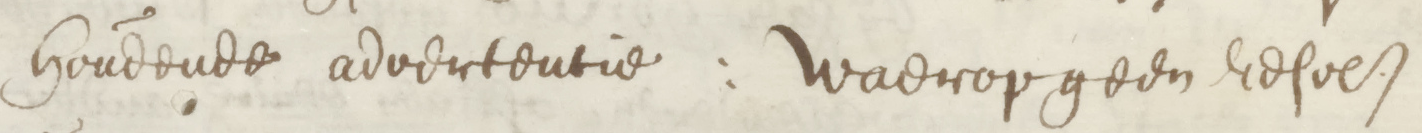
houdende advertentie: Waerop geen resol
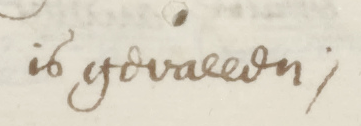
is gevallen.
